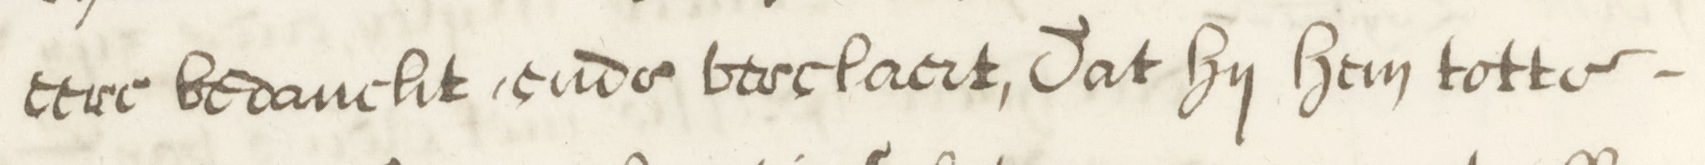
eere bedanckt, ende verclaert, dat hy hem totte
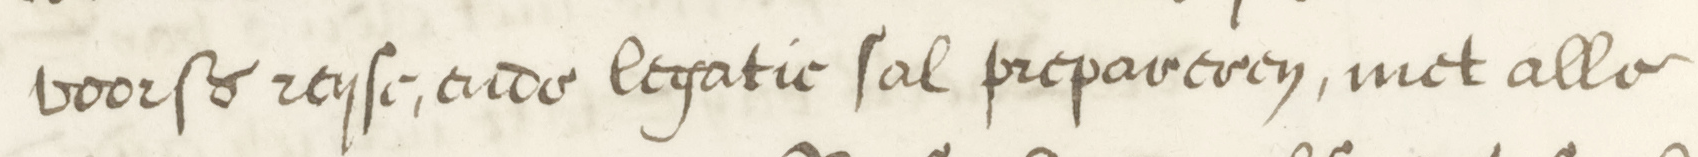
voors reyse, ende legatie sal prepareren, met alle
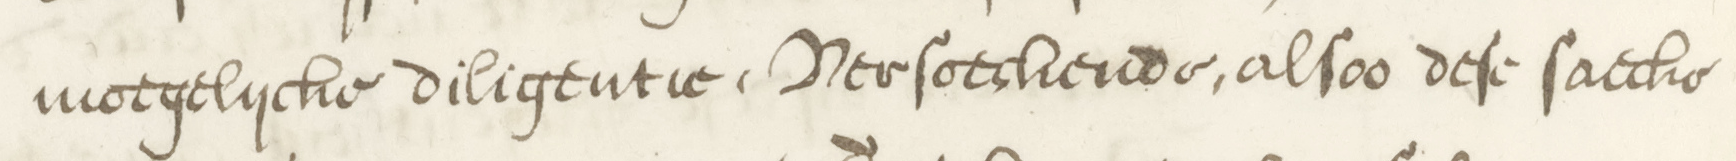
moegelycke diligentie. Versoeckende, alsoo dese saecke
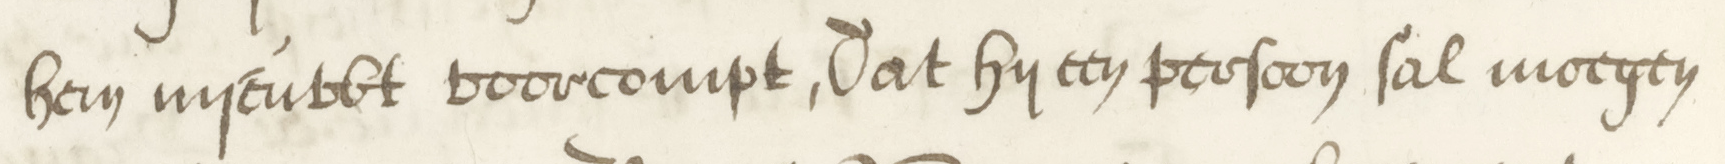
hem nyeuwt voorcompt, dat hy een persoon sal moegen
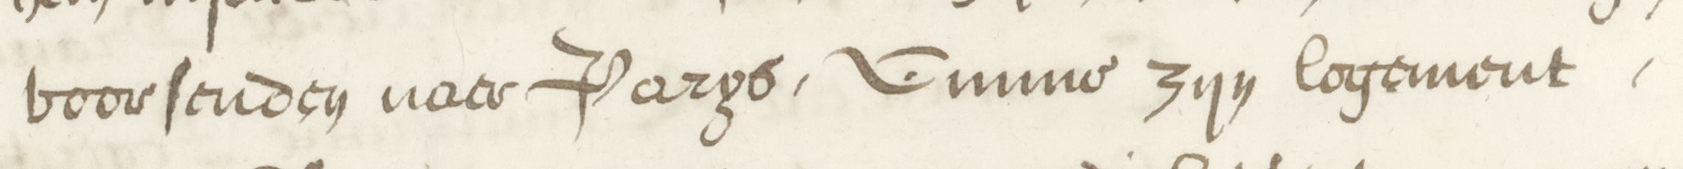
voorsenden naer Parys, Omme zijn logement,
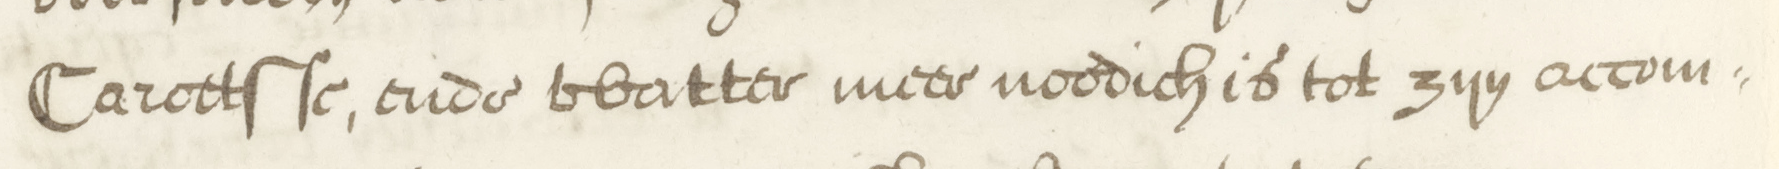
Caroetsse, ende watter meer noodich is tot zyn accom,,
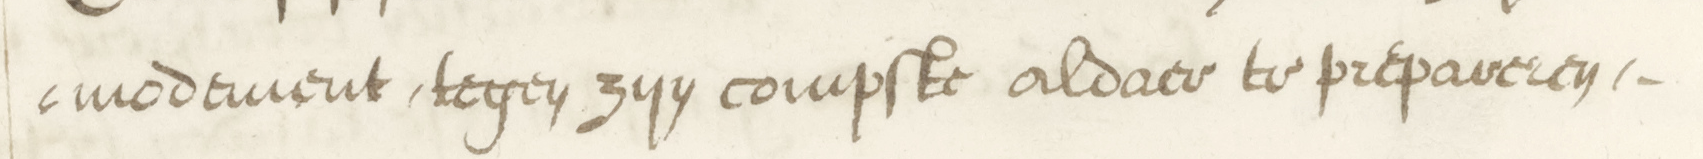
,,modement, tegen zyn compste aldaer te prepareren
